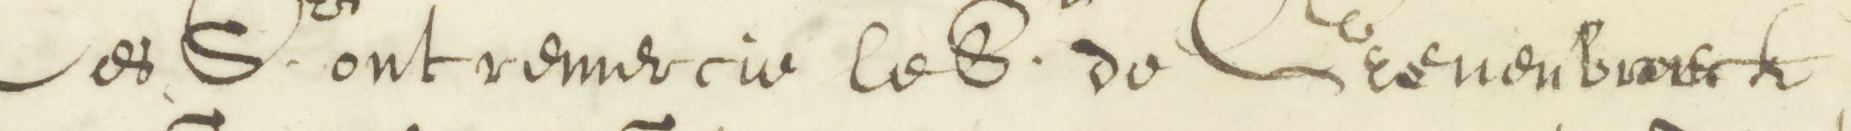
Les Srs ont remercie le Sr de Grevenbroeck
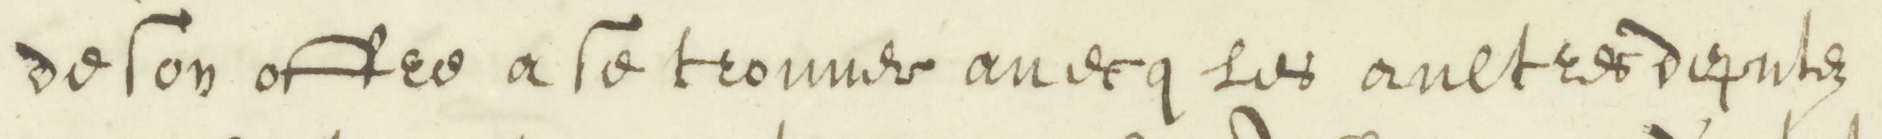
de son offre a se trouver avecq les aultres deputez
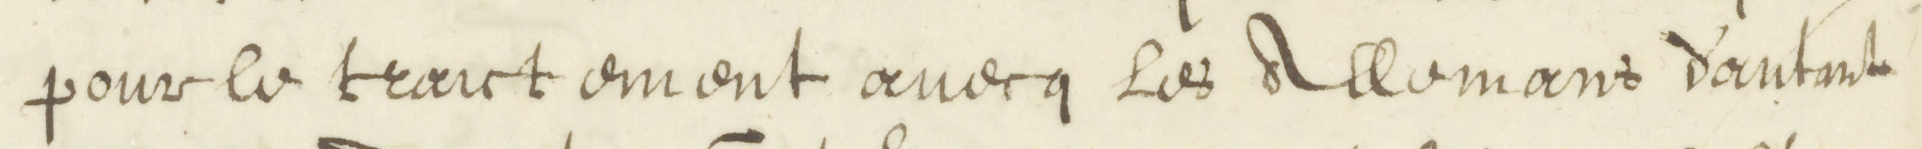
pour le traictement avecq les Allemans d'autant
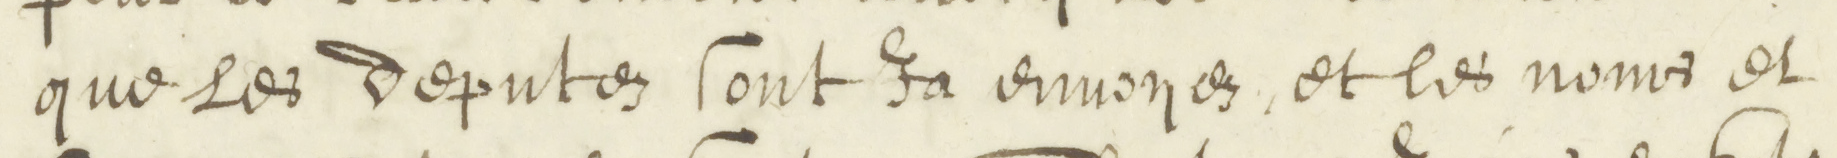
que les deputez sont ja envoyez et les noms et
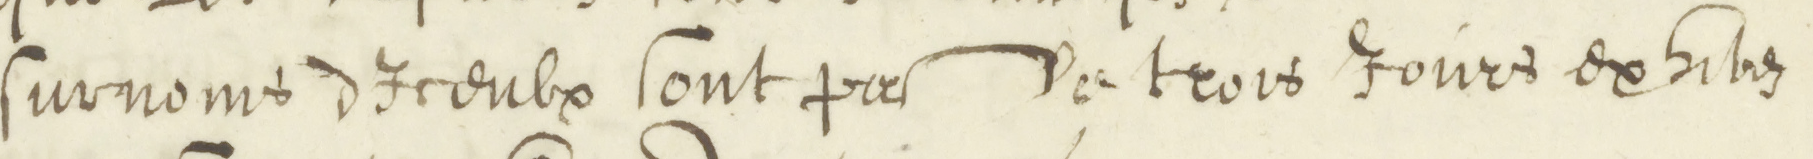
surnoms diceulx sont passe trois jours exhibez
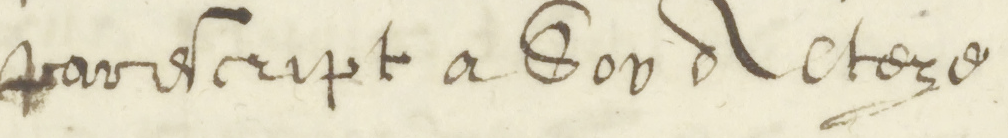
par escript a Son Alteze.
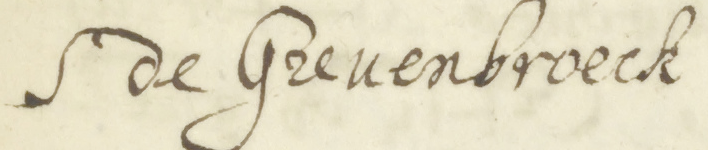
Sr de Grevenbroeck
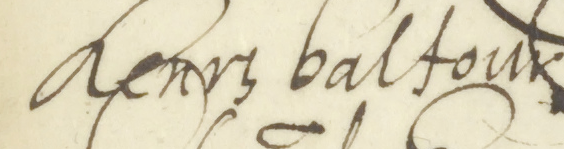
Henry Balfour
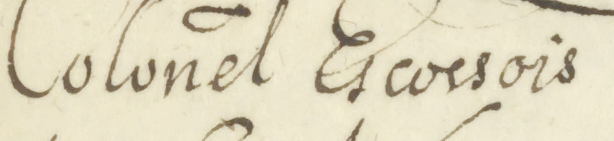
Colonnel Escossois
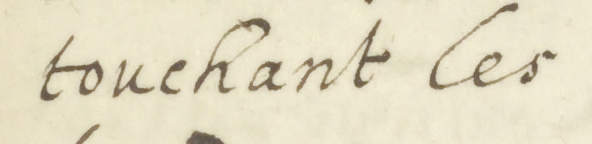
touchant les
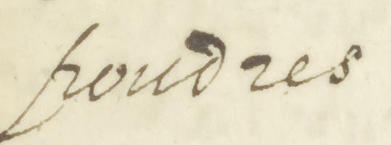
poudres
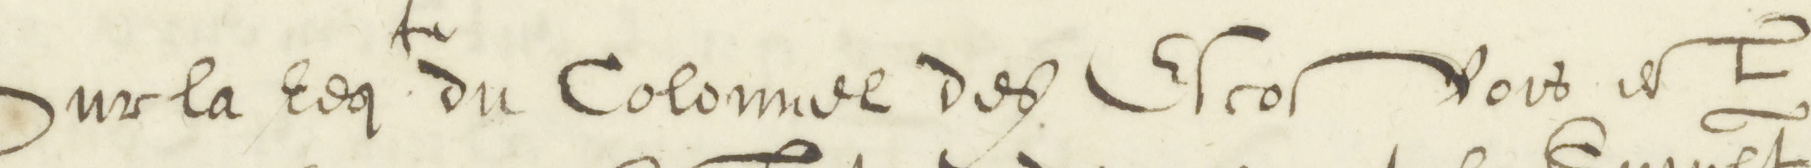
Sur la reqte du Colonnel des Escossois est
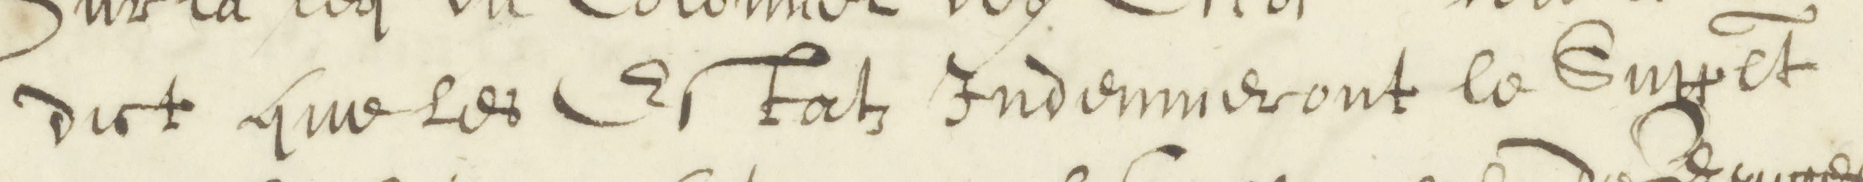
dict que les Estatz indemneront le Supplt
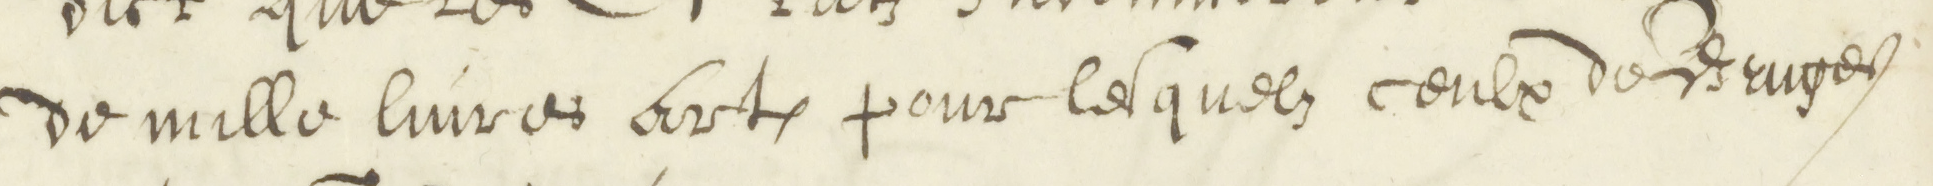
de mille livres arth pour lesquelz ceulx de Bruges
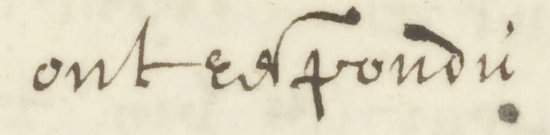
ont respondu.
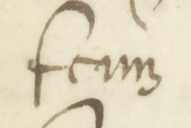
fcum
